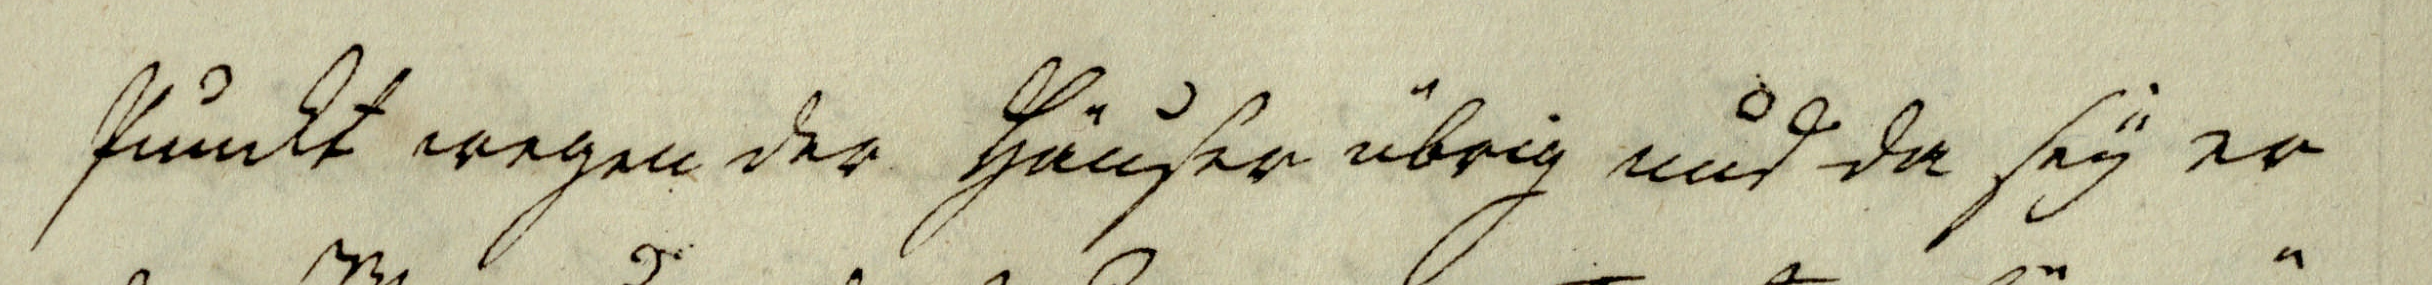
Punkt wegen der Häuser übrig und da seÿ er
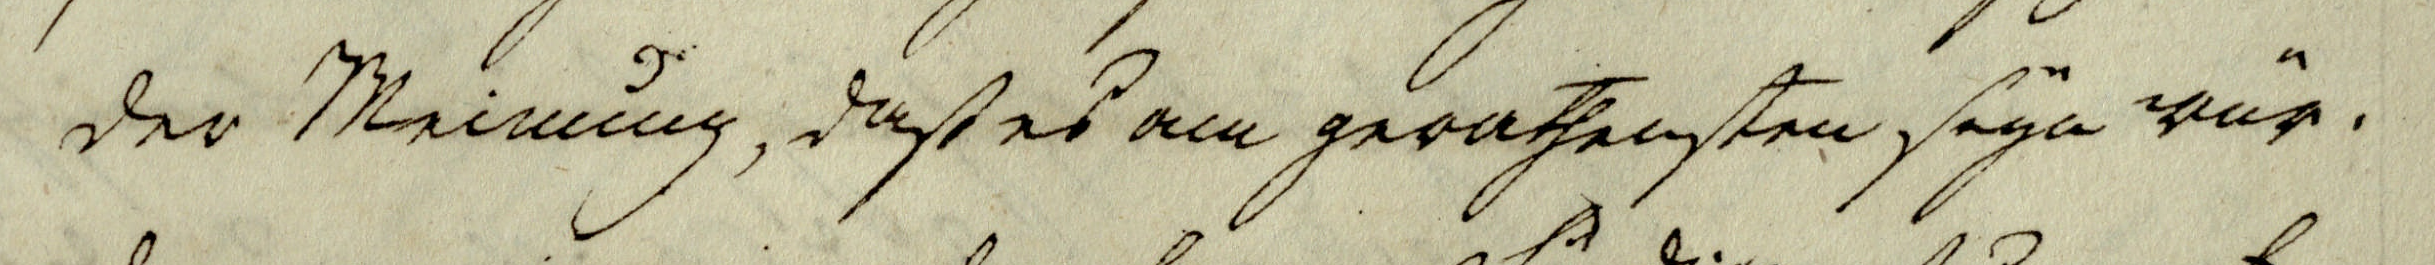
der Meinung, daß es am gerathensten seÿn wür¬
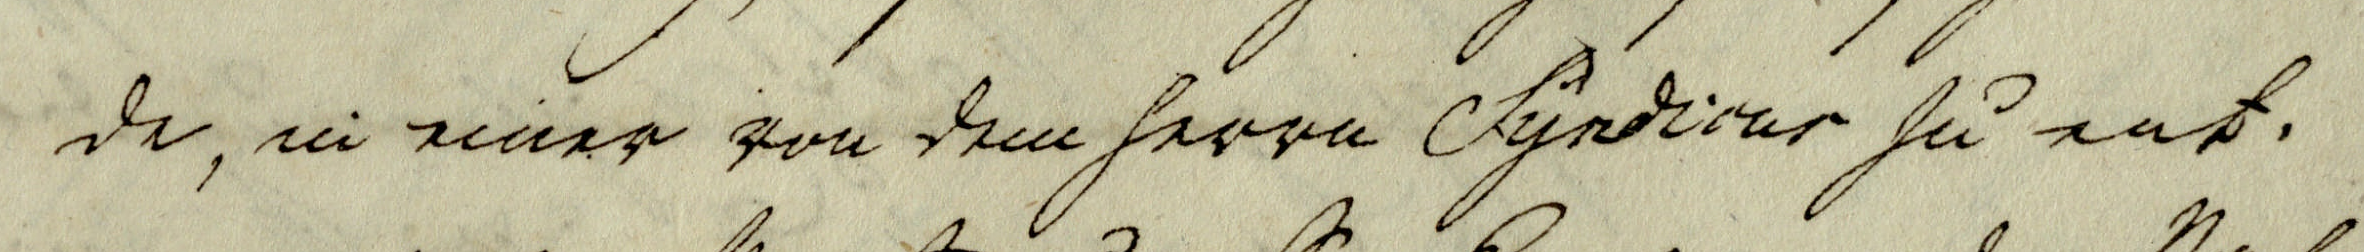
de, in einer von dem Herrn Sÿndicus zu ent¬
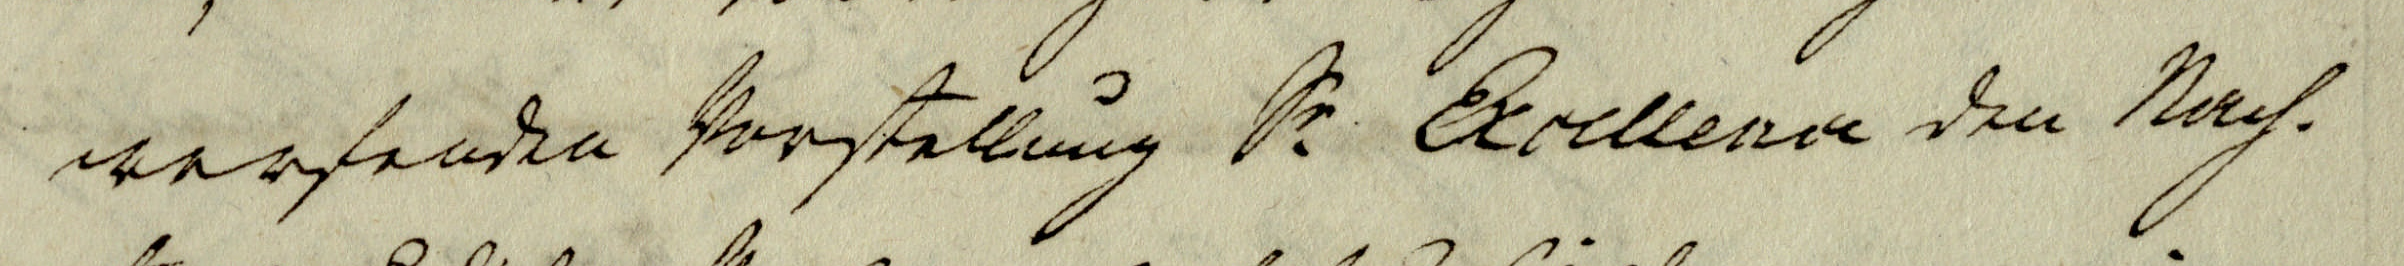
werfenden Vorstellung Sr Excellence den Nach¬
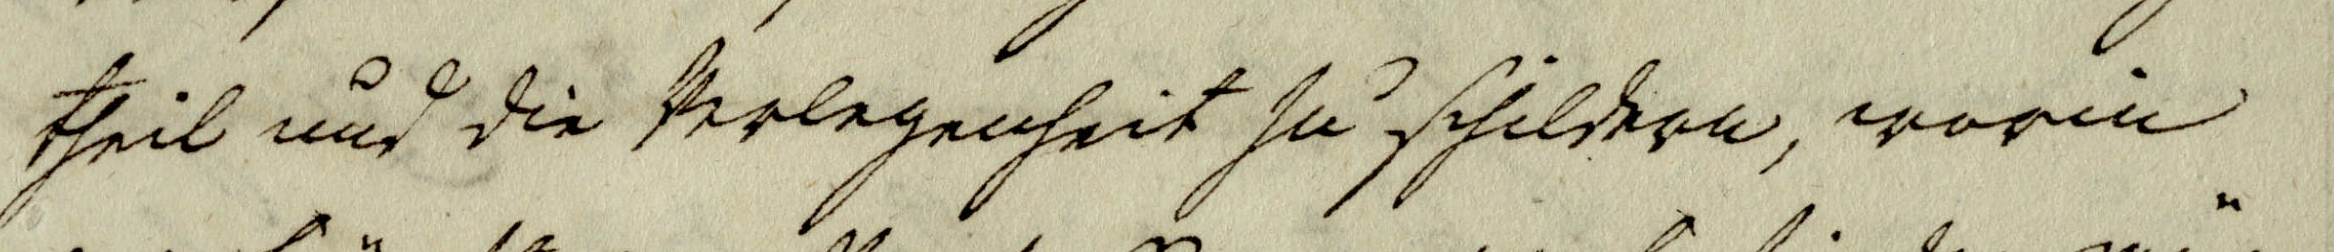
theil und die Verlegenheit zu schildern, worin
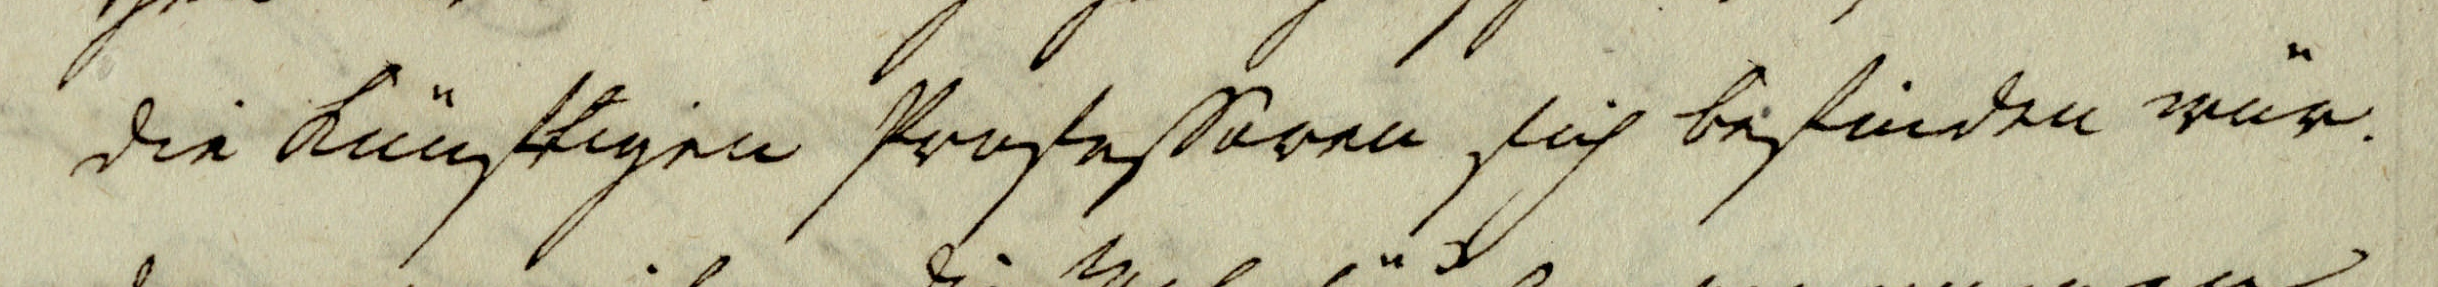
die künftigen Professoren sich befinden wür¬
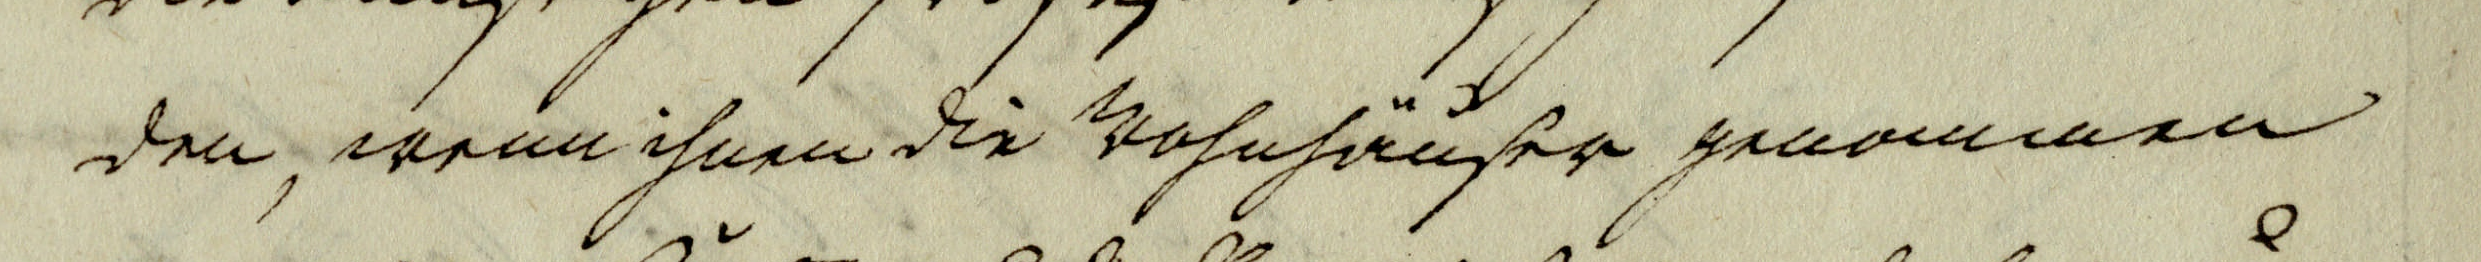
den, wenn ihnen die Wohnhäuser genommen
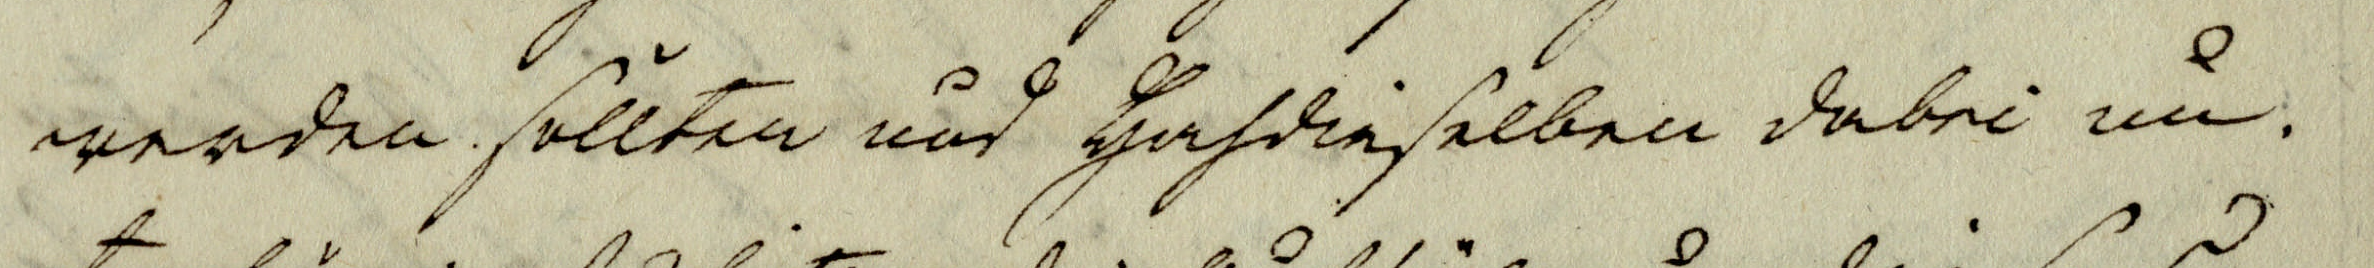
werden sollten und Hochdieselben dabei un¬
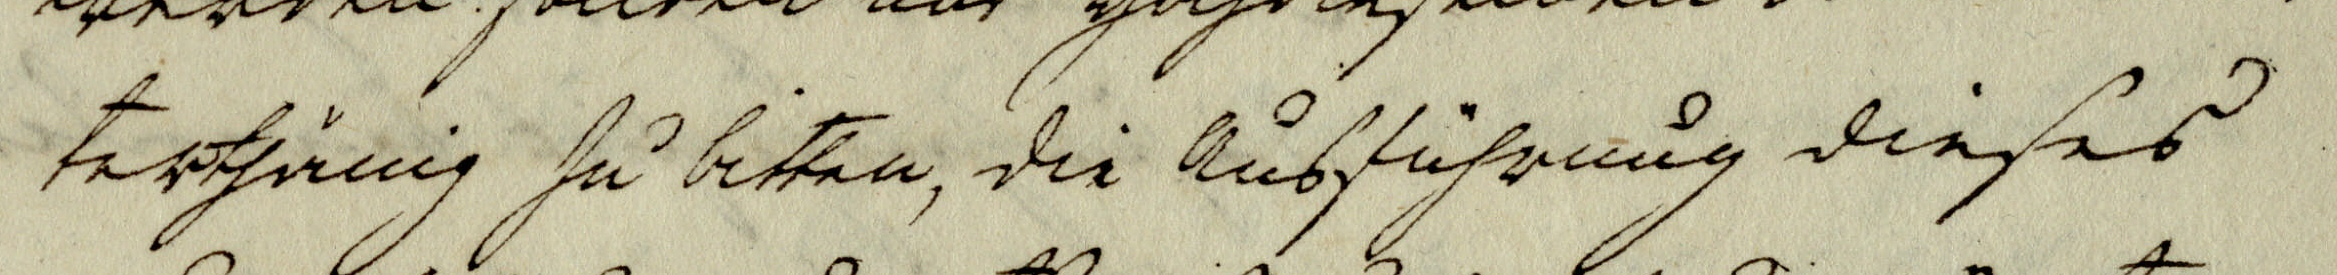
terthänig zu bitten, die Ausführung dieses
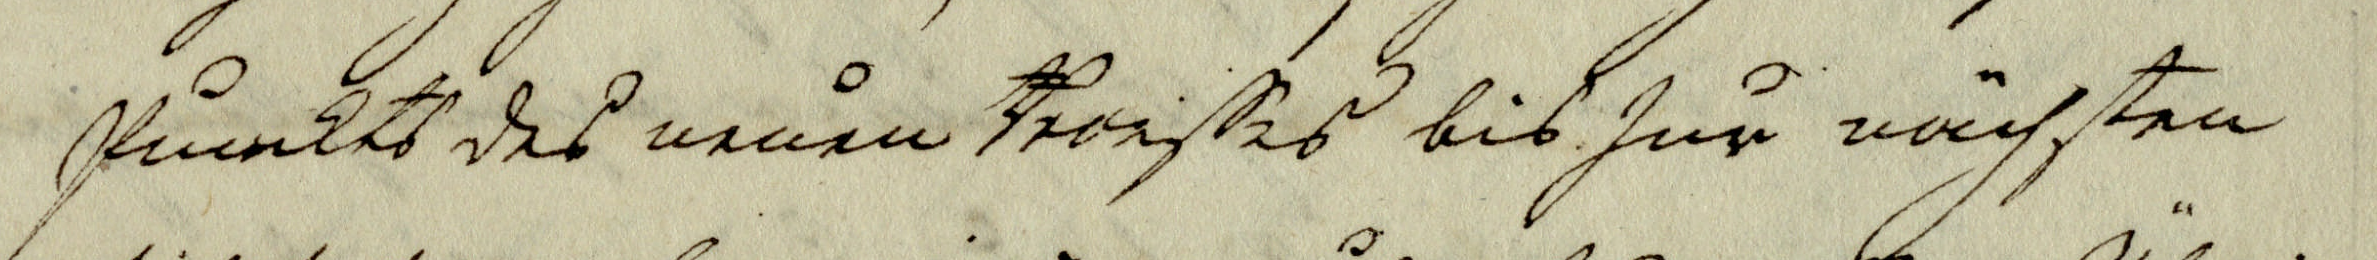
Punckts des neuen Recesses bis zur nächsten
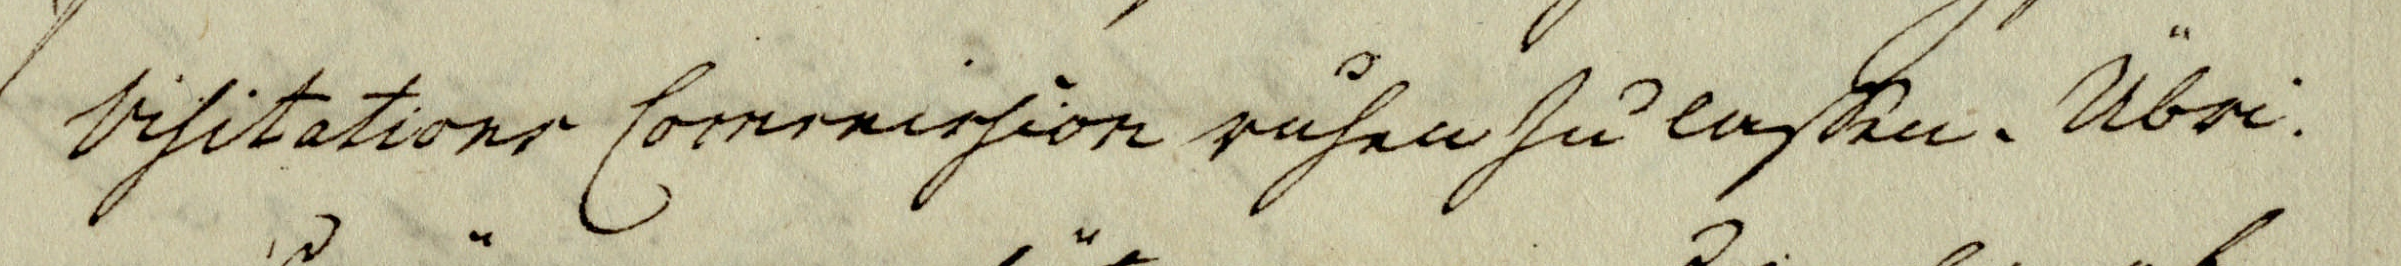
Visitations Commission ruhen zu lassen. Übri¬
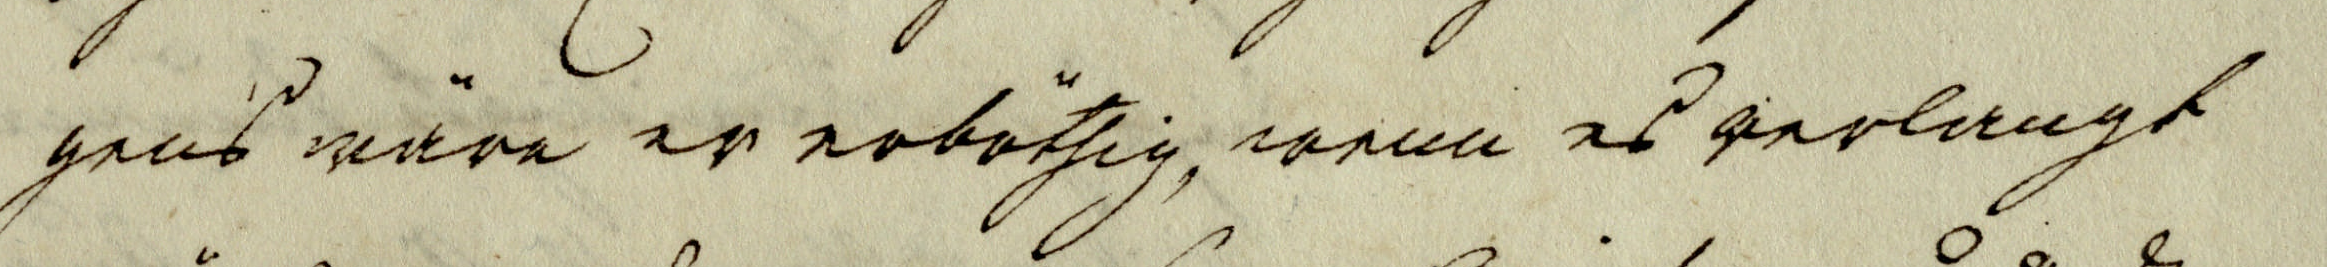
gens wäre er erböthig, wenn es verlangt
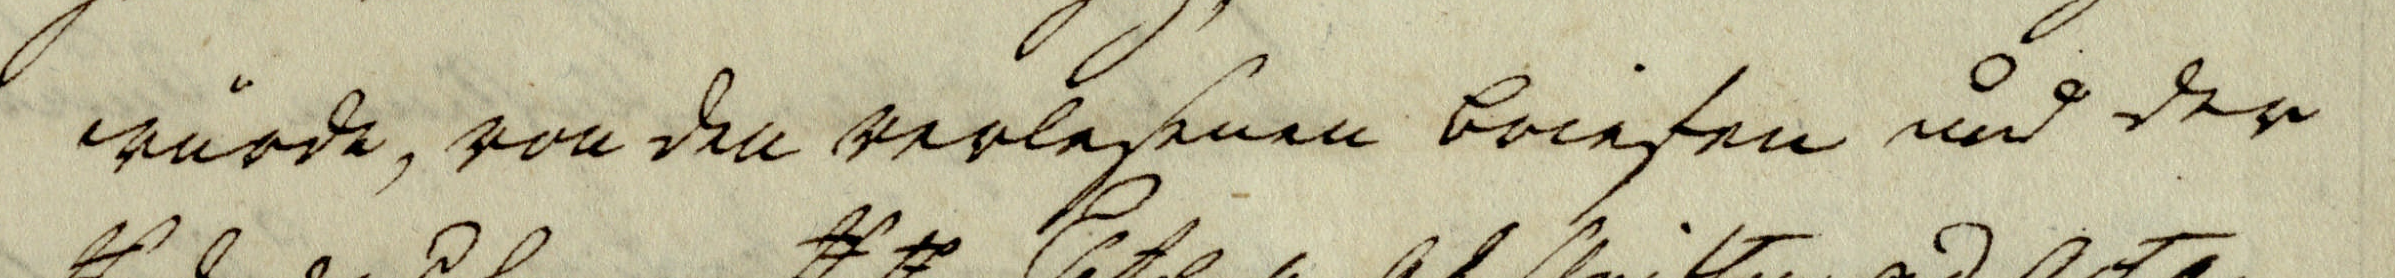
würde, von den verlesenen Briefen und der
